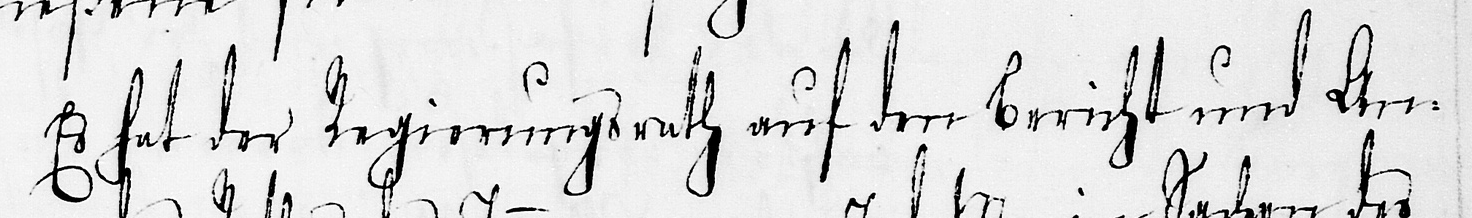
Es hat der Regierungsrath auf den Bericht und An¬
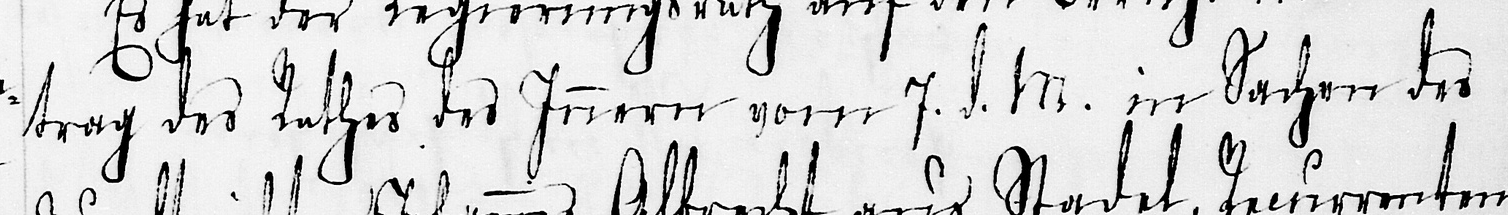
trag des Rathes des Innern vom 7. d. M. in Sachen des
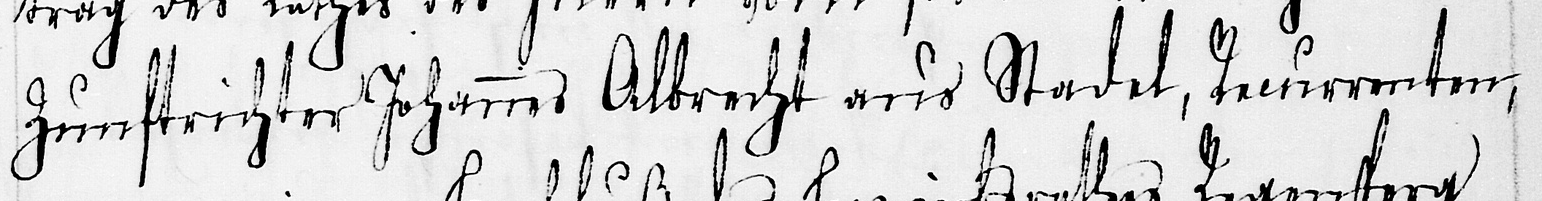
Zunftrichter Johannes Albrecht aus Stadel, Recurrenten,
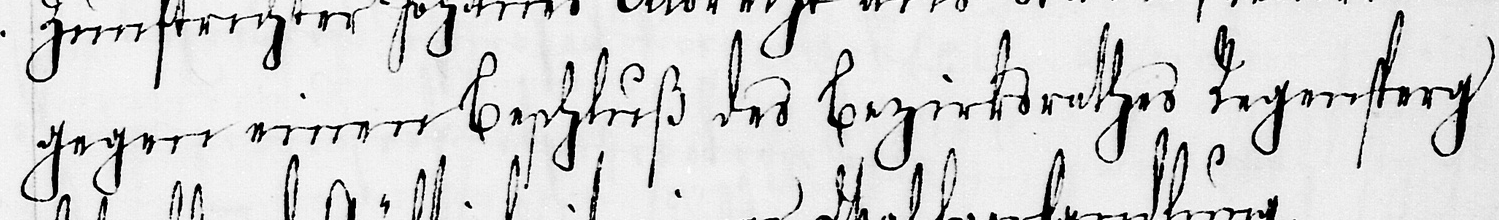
gegen einen Beschluß des Bezirksrathes Regensperg
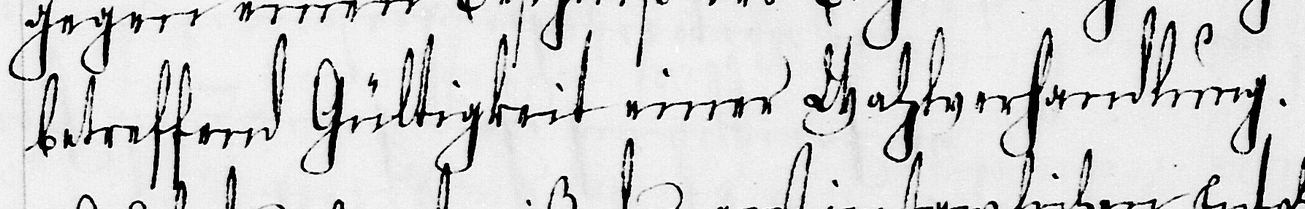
betreffend Gültigkeit einer Wahlverhandlung.
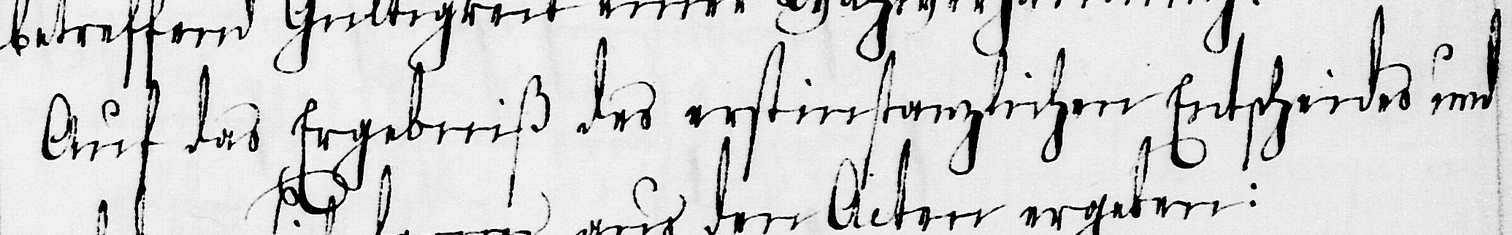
Auf das Ergebniß des erstinstanzlichen Entscheides und
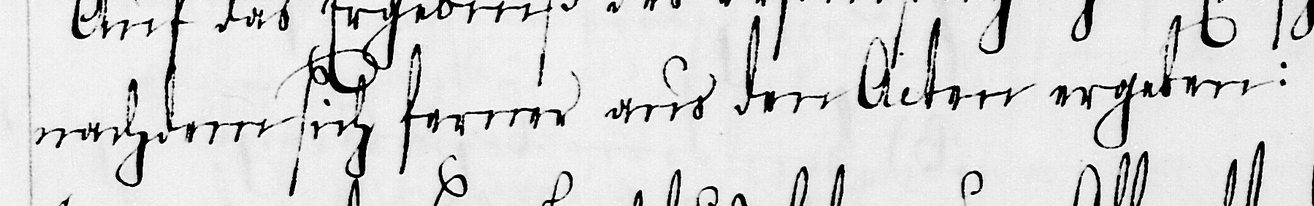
nachdem sich ferner aus den Acten ergeben:
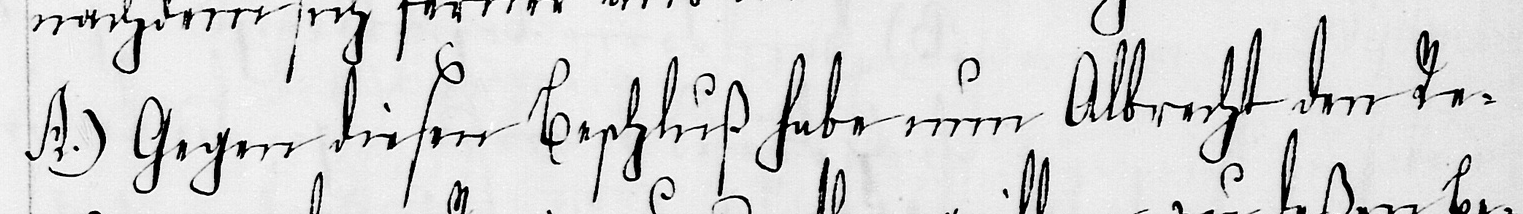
A.) Gegen diesen Beschluß habe nun Albrecht den Re¬
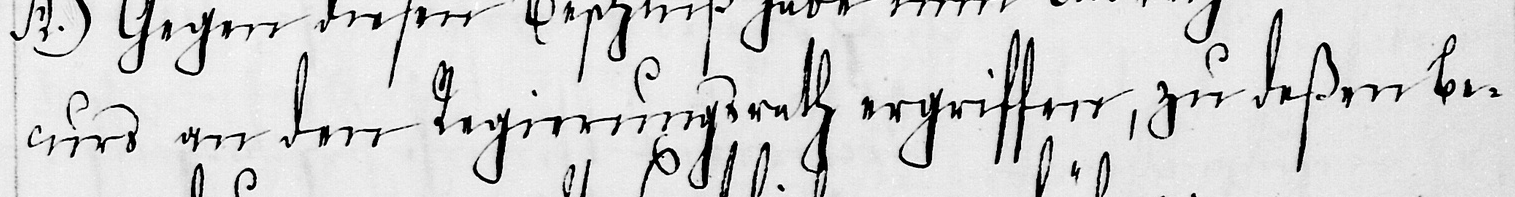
curs an den Regierungsrath ergriffen, zu deßen Be¬
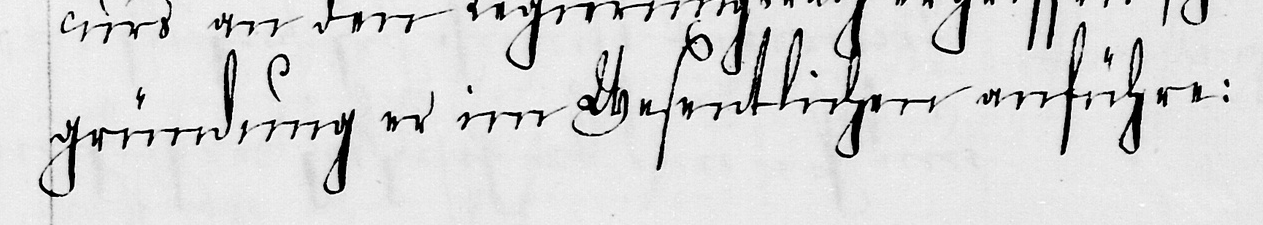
gründung er im Wesentlichen anführe:
